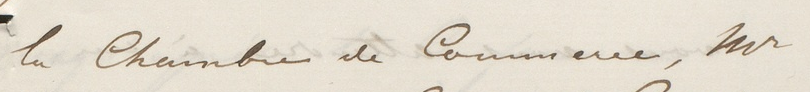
la Chambre de Commerce, Mr
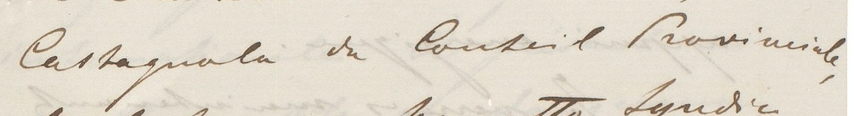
Castagnola du Conseil Provinciale,
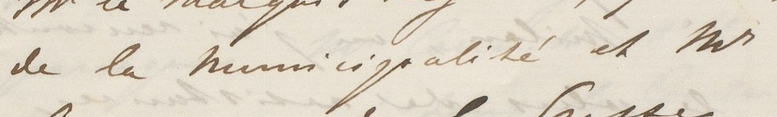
de la Municipalité et Mr
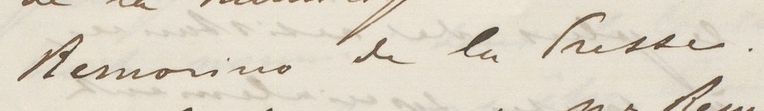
Remorino de la Presse.
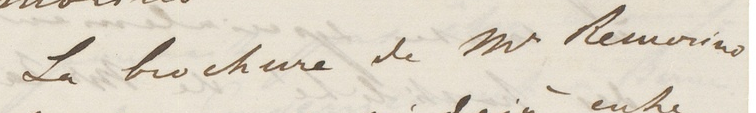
La brochure de MrRemorino
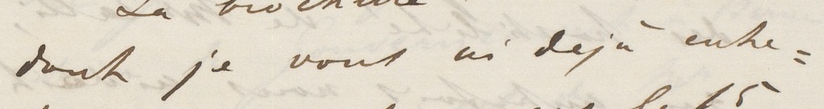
dont je vous ai dejà entre-
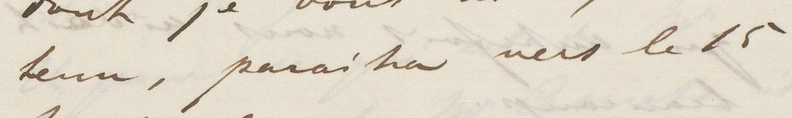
tenu, paraitra vers le 15
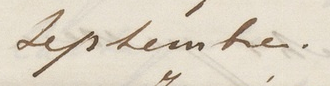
Septembre.
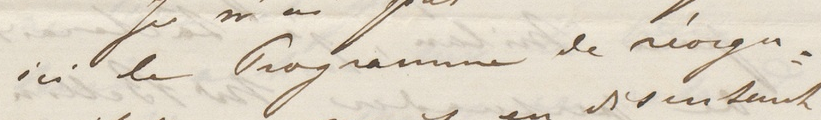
ici le Programme de réorga-
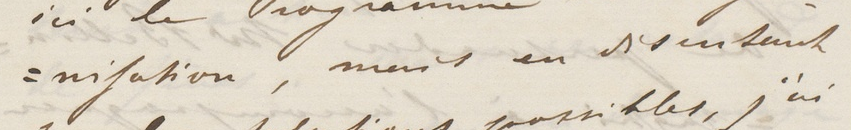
nisation, mais en discutant
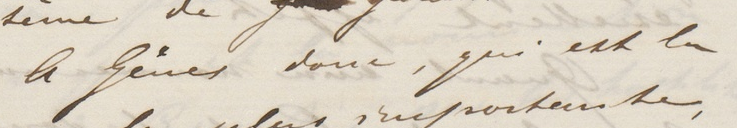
A Gênes donc, qui est la
